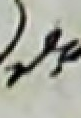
do
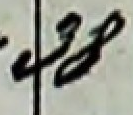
38
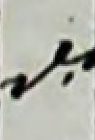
do
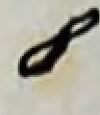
8
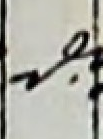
do
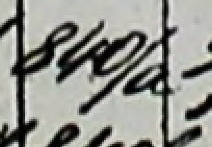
840/a
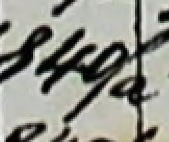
840/a
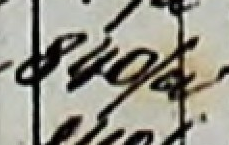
840/a
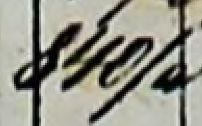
840/a
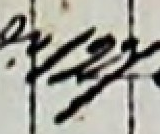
127
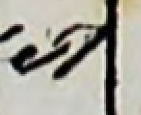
51
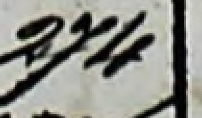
274
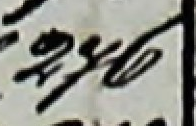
276
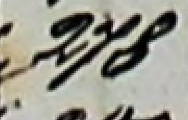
278
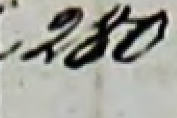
280
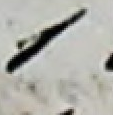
1
